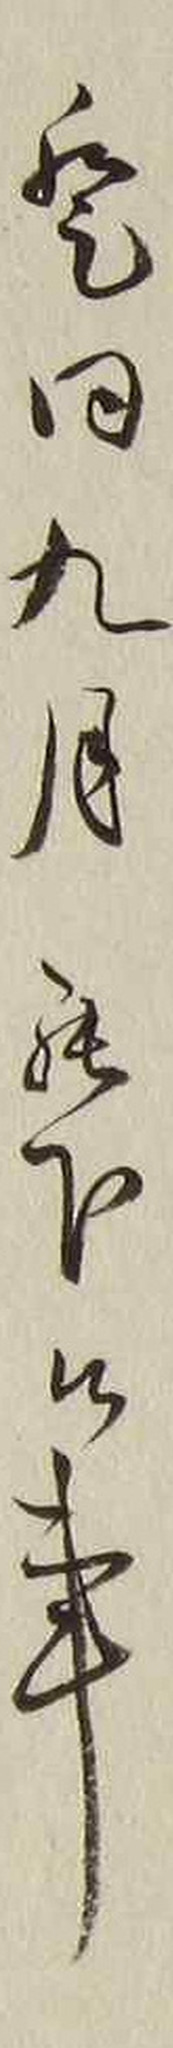登同九月罷下候事
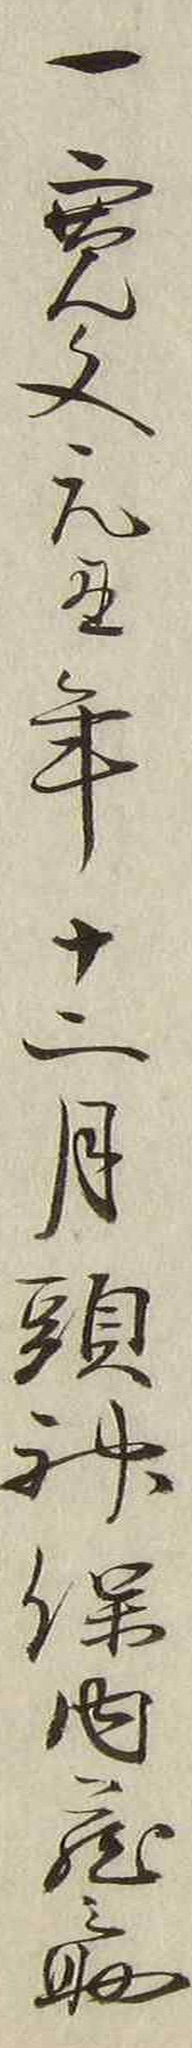一寛文元丑年十二月頭神保内蔵之助
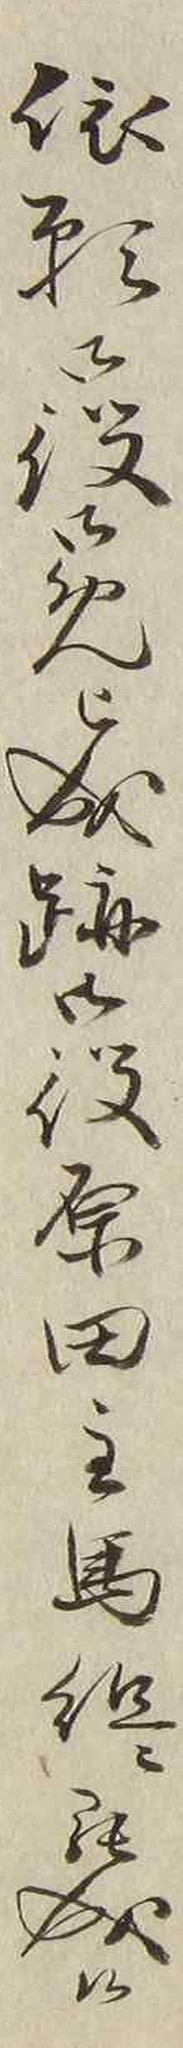依願御役御免被成跡御役原田主馬組に罷成候

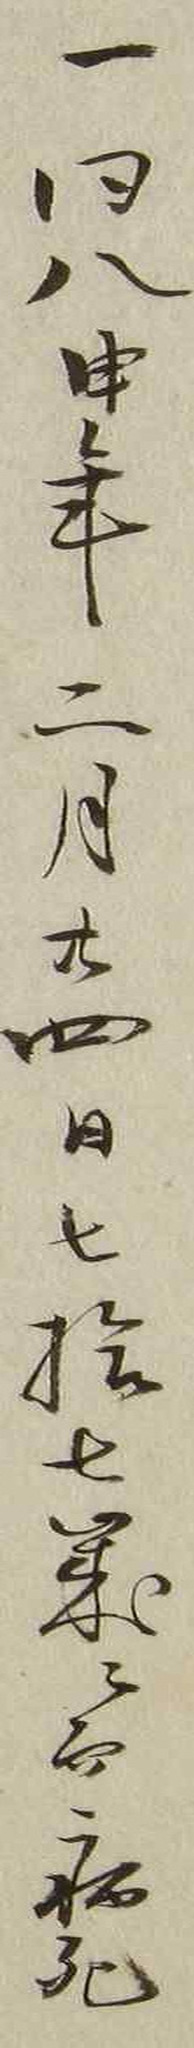一同八申年二月廿四日七拾七歳に而病死
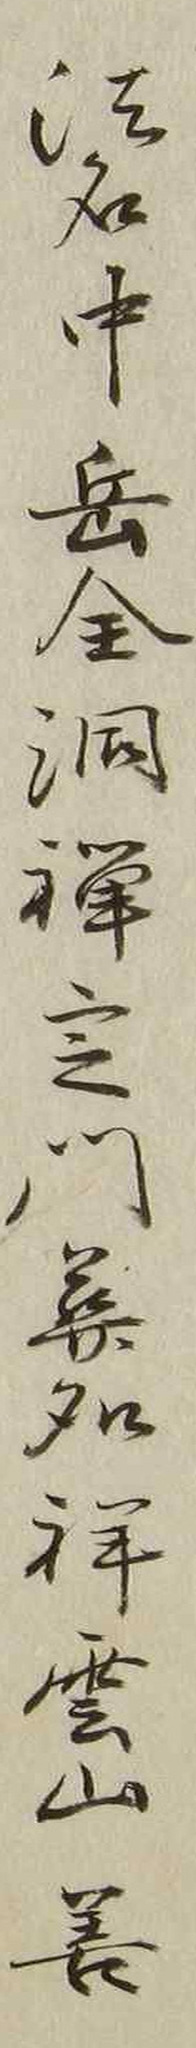法名中岳全洞禅定門葬処祥雲山善
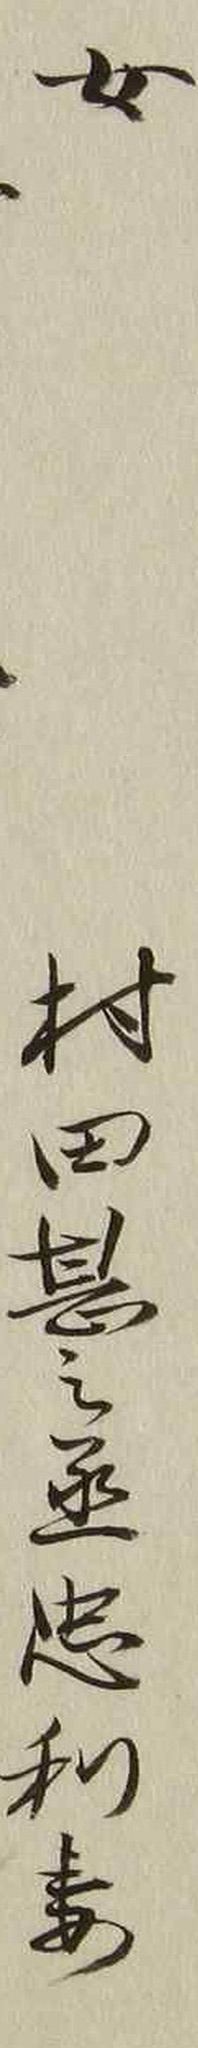女村田甚之丞忠利妻
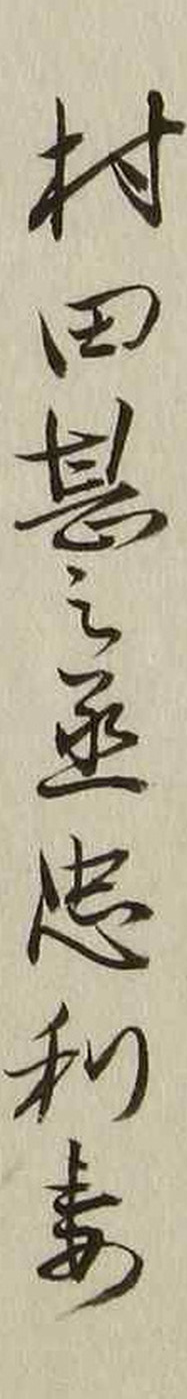女村田甚之丞忠利妻
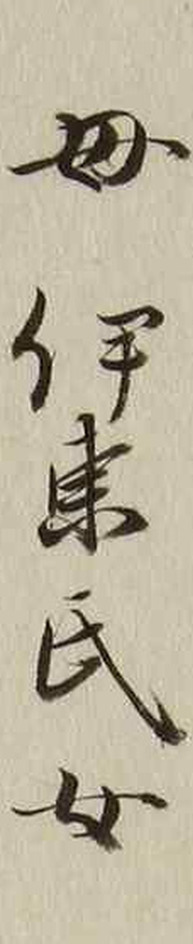母伊東氏女
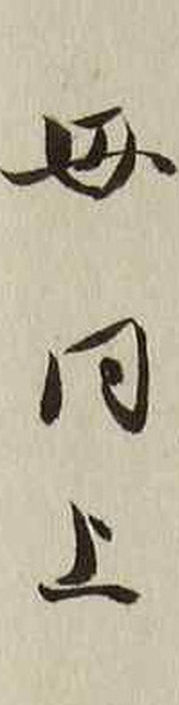母同上
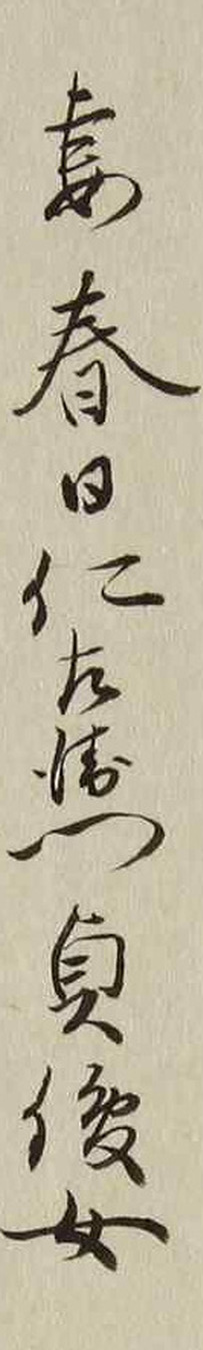妻春日仁左衛門貞俊女
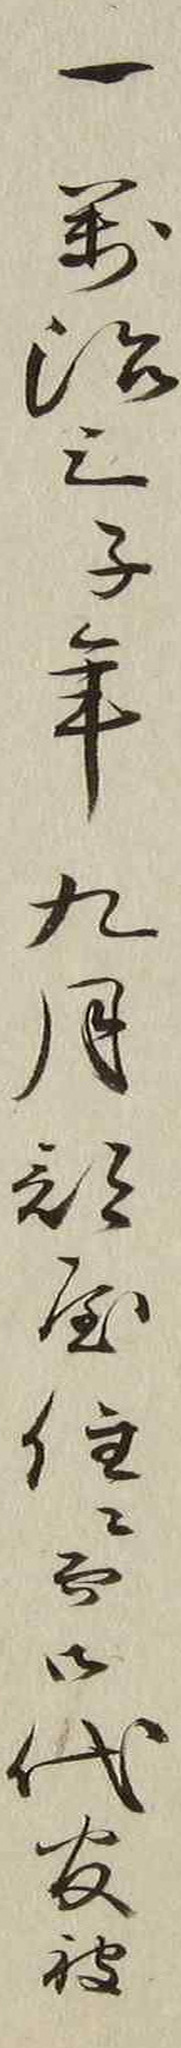一万治三子年九月部屋住に而御代官被
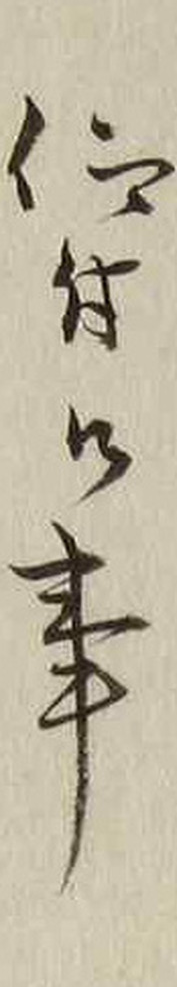仰付候事
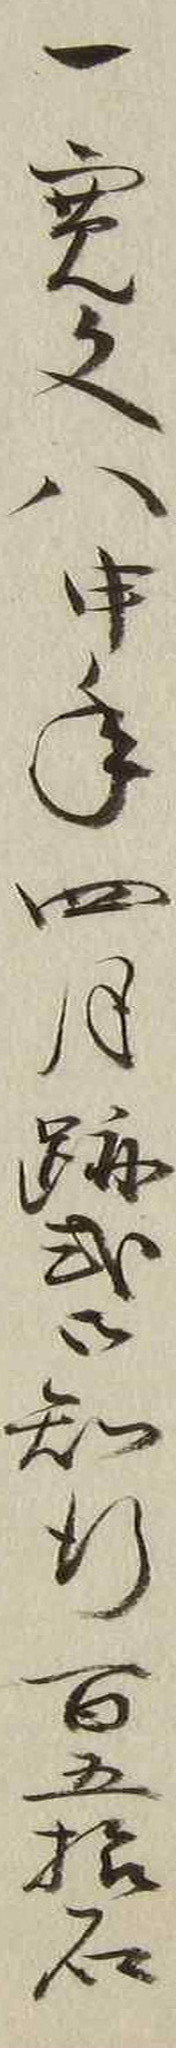一寛文八申年四月跡式御知行百五拾石
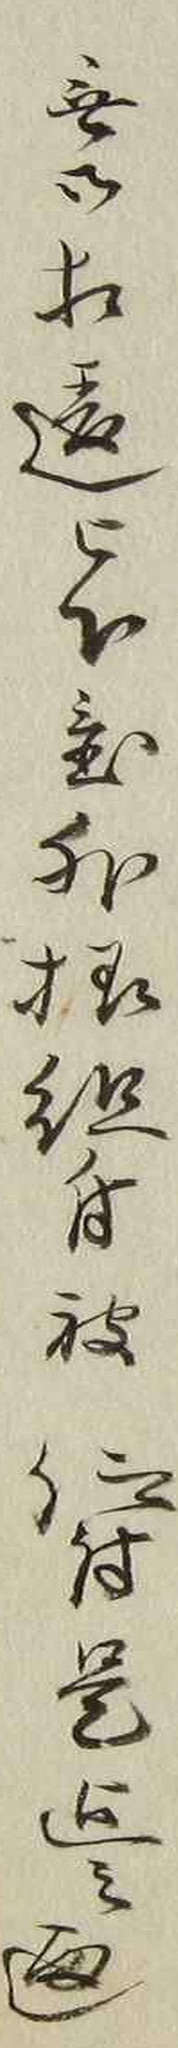無御相違被下置外様組付被仰付是迄之通
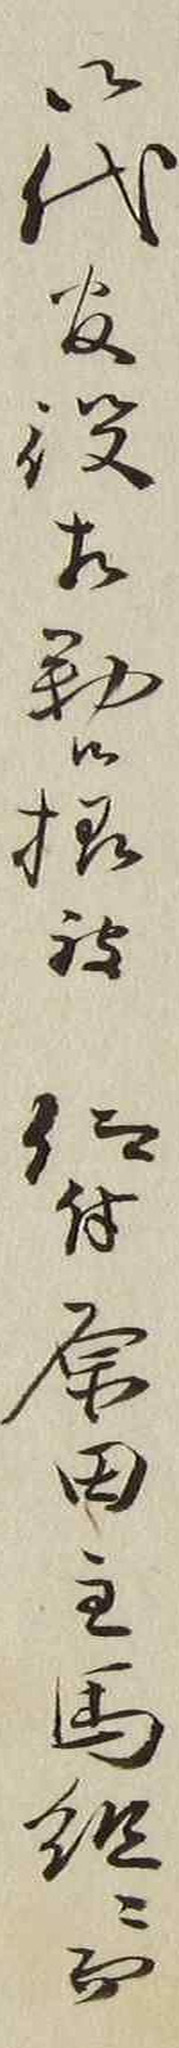御代官役相勤候様被仰付原田主馬組に而
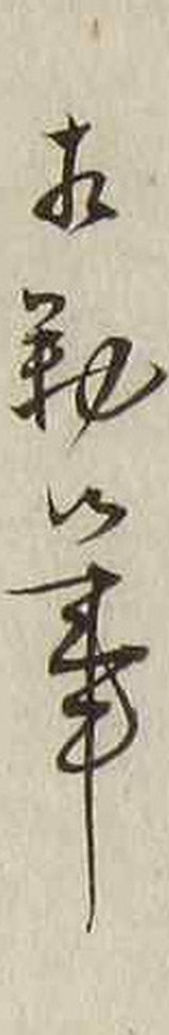相勤候事
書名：諸士系譜　巻之157　ね之部1
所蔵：会津若松市立会津図書館
